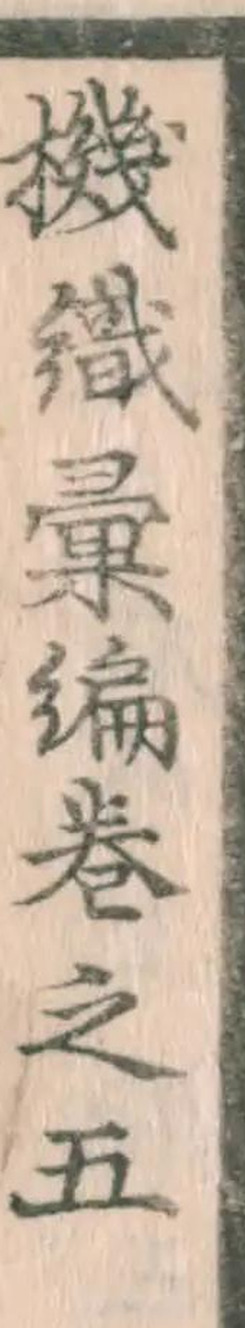機織彙編巻之五
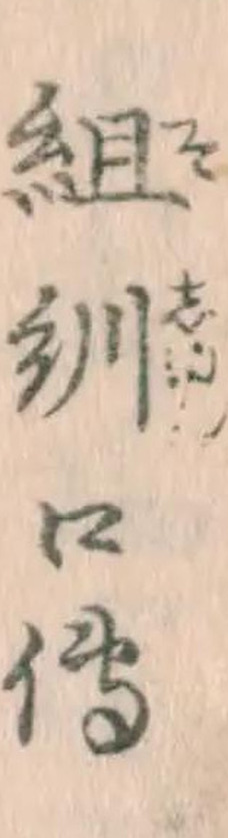組紃口伝
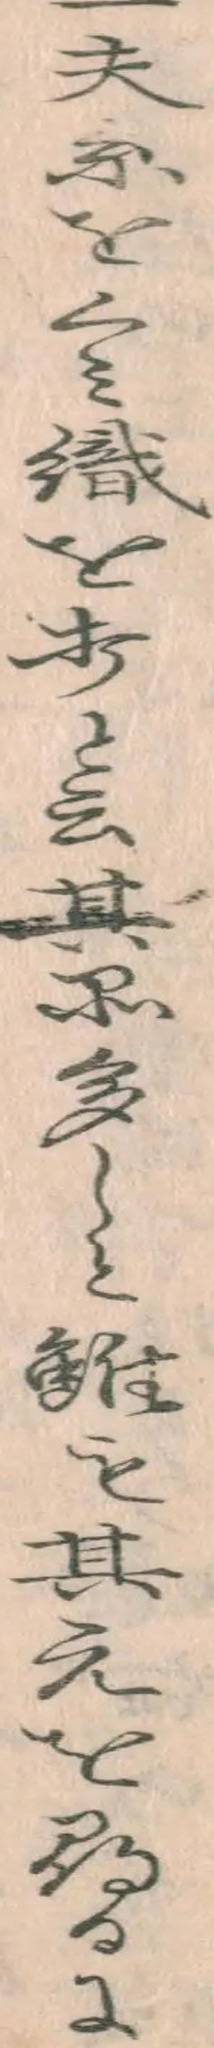一夫糸をくみ織を打と云其品多しと雖も其元を尋るに
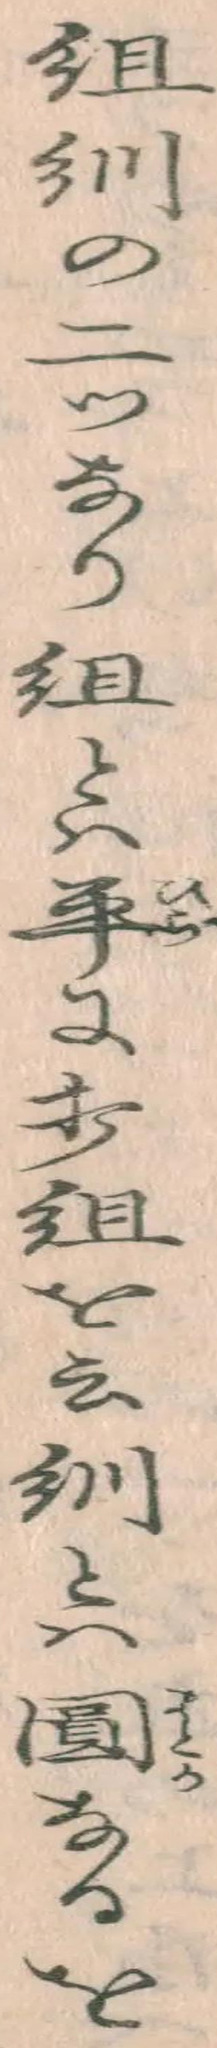組紃の二ッなり組とは平に打組を云紃とは円なるを
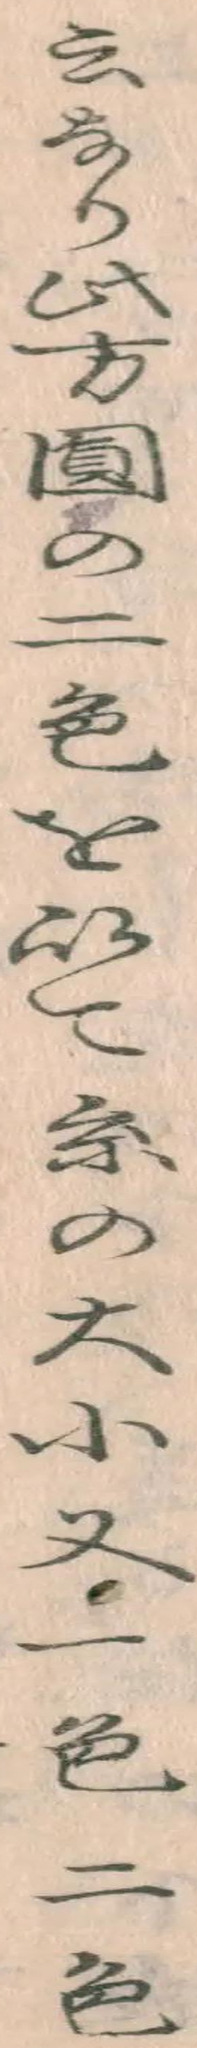云なり此方円の二色を以て糸の大小又一色二色
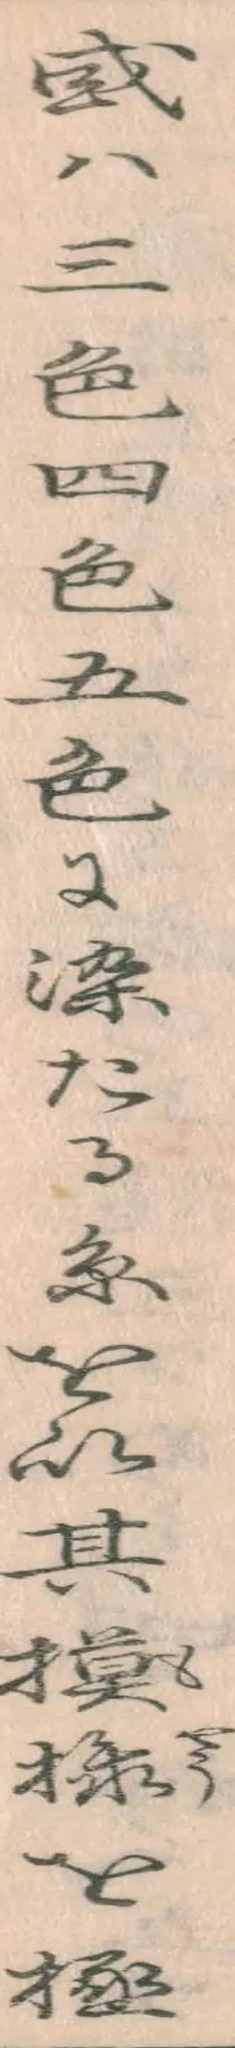或は三色四色五色に染たる糸を以其模様を極
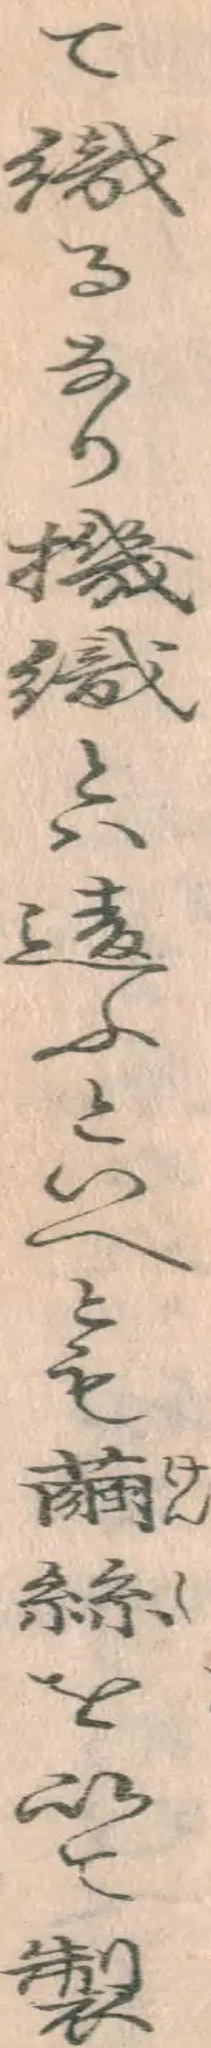て織るなり機織とは違ふといへとも繭糸を以て製
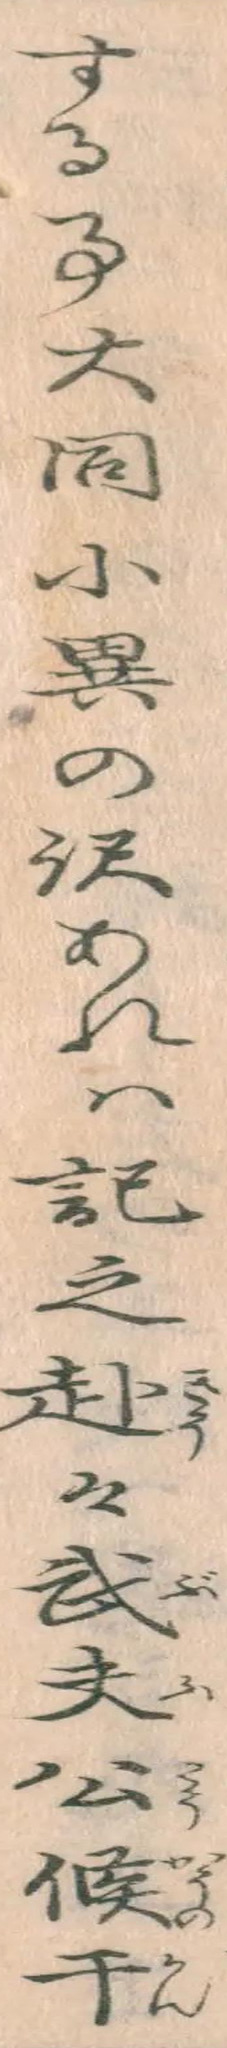する事大同小異の訳あれは記之赴々武夫公候干
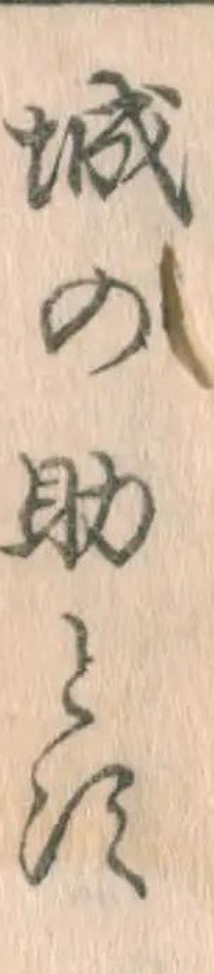城の助とす
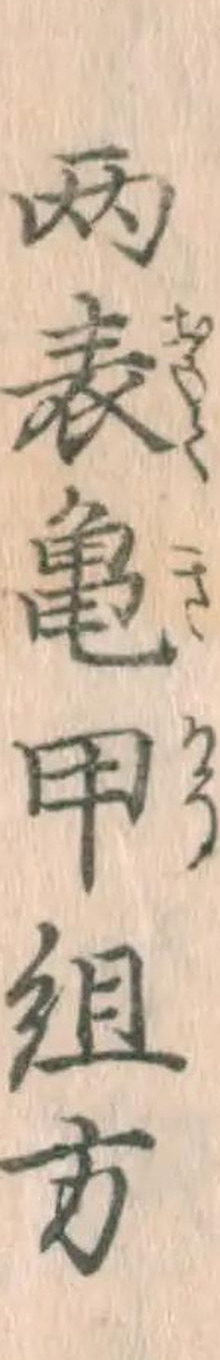両表亀甲組方
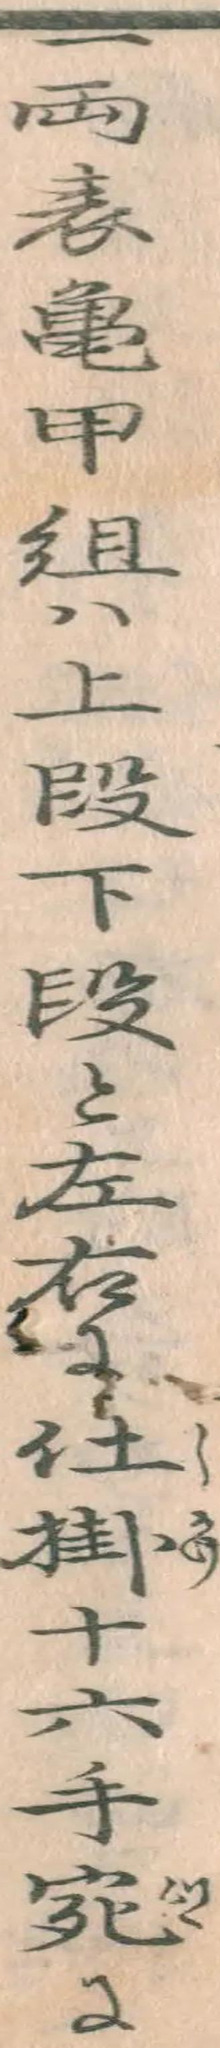一両表亀甲組は上段下段と左右に仕掛十六手宛に
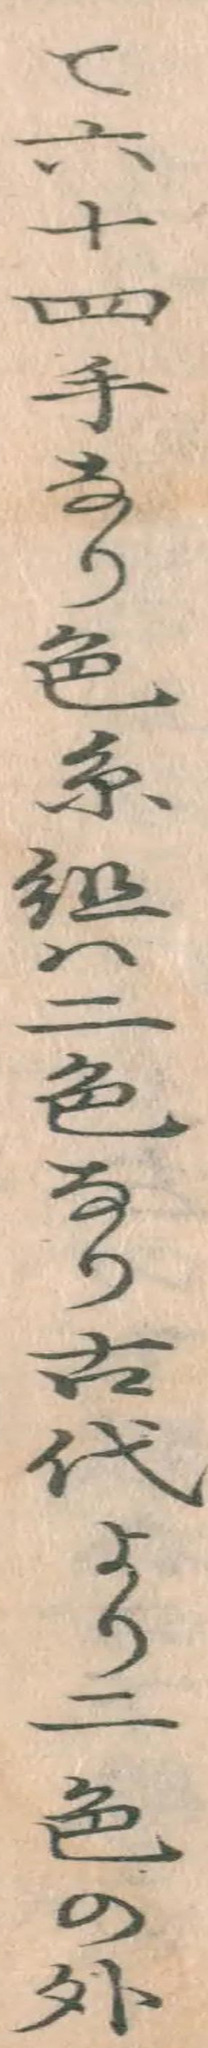て六十四手なり色糸組は二色なり古代より二色の外

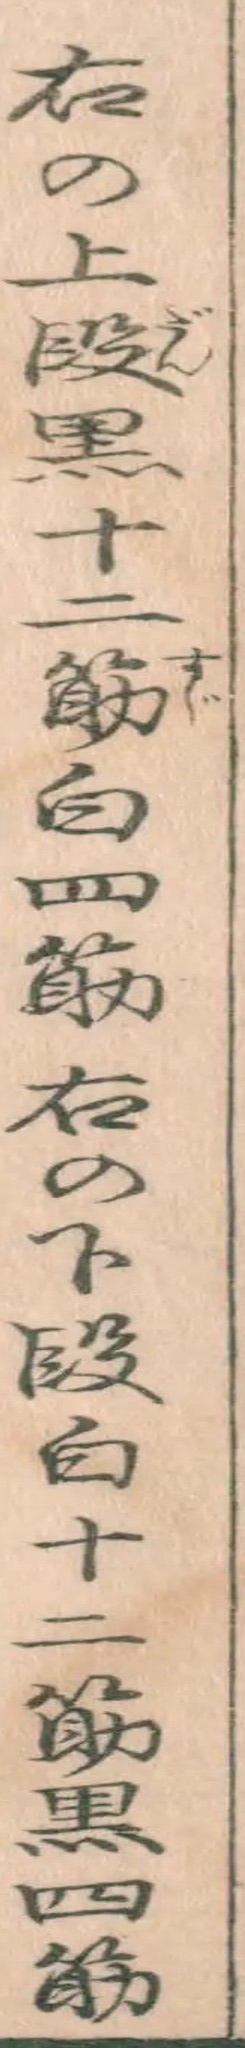右の上段黒十二筋白四筋右の下段白十二筋黒四筋
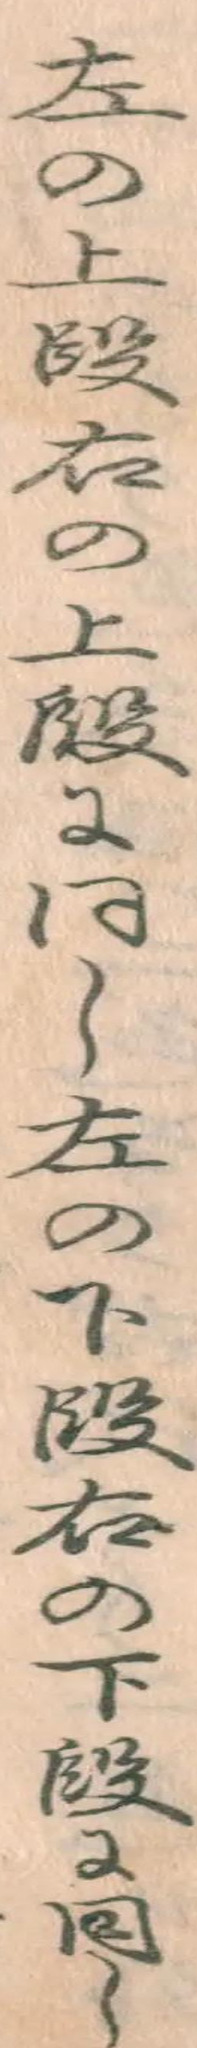左の上段右の上段に同し左の下段右の下段に同し
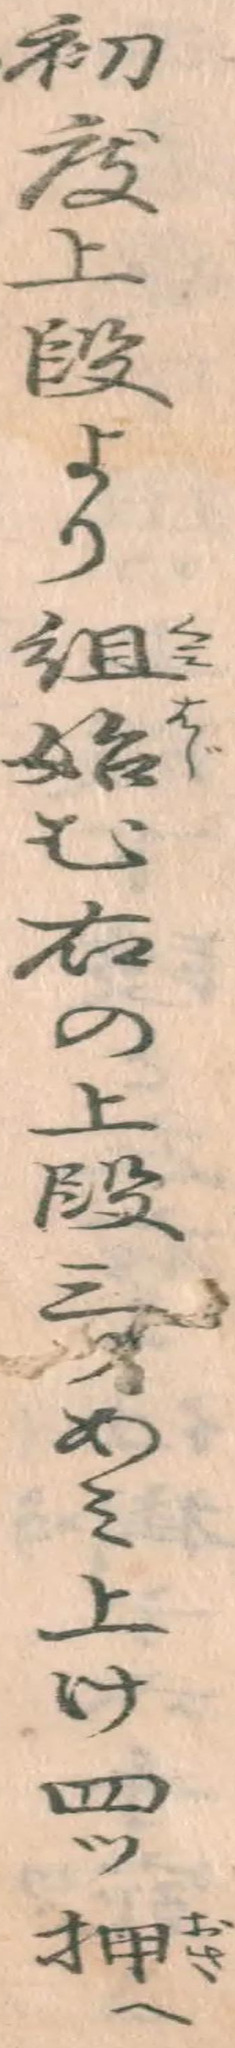初度上段より組始む右の上段三ッあみ上け四ッ押へ
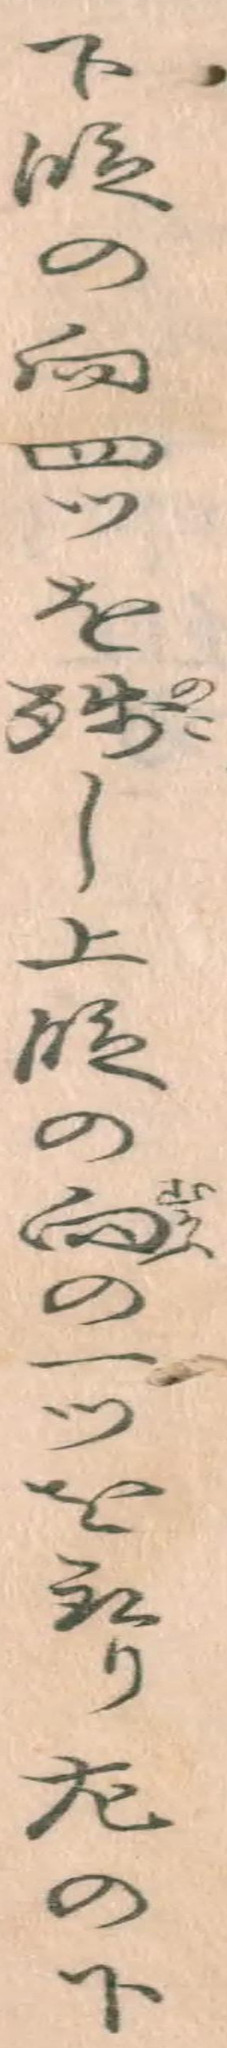下段の向四ッを残し上段の向の一ッを取り左の下
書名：機織彙編 5巻. [2]
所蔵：国立国会図書館 National Diet Library, JAPAN
